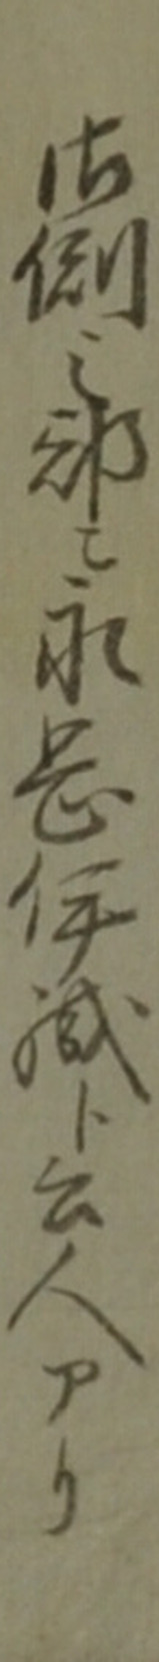御側之部ニ永岡伊織ト云人アリ
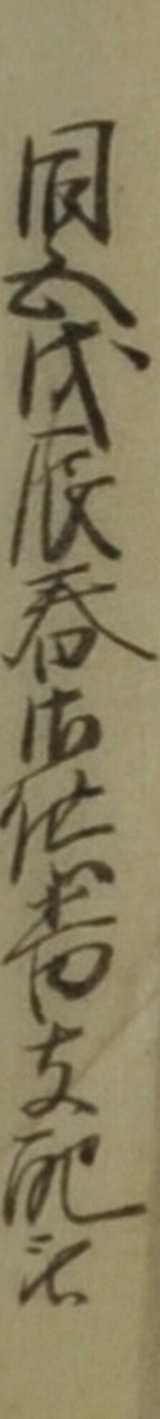同五戊辰春御供番支配被
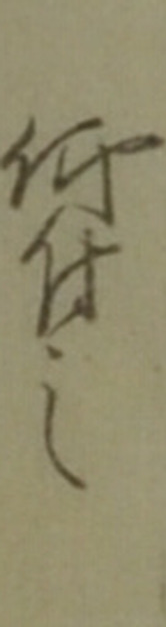仰付之
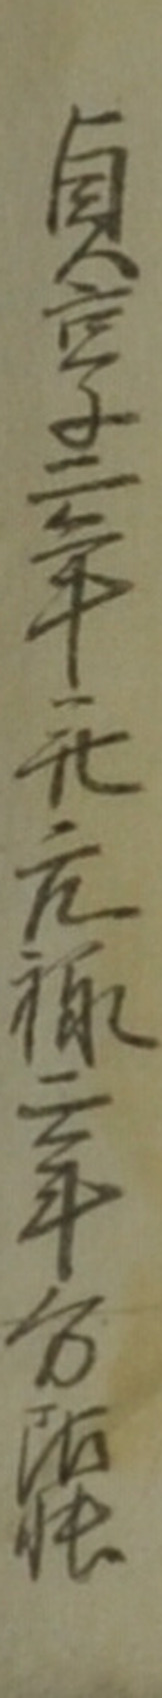貞享二年并元禄二年分限帳
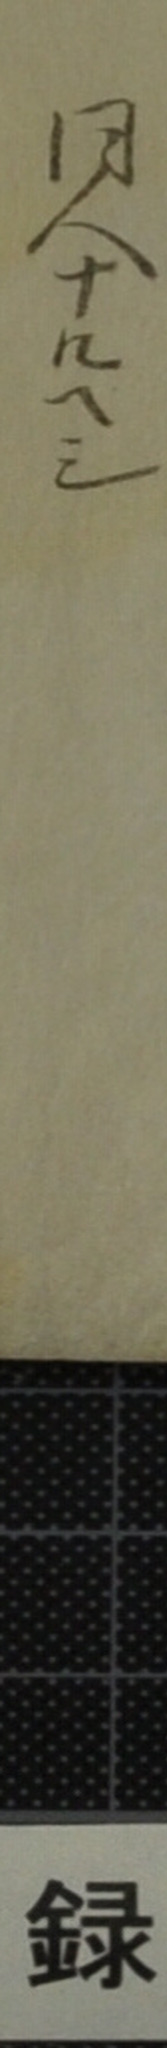同人ナルヘシ
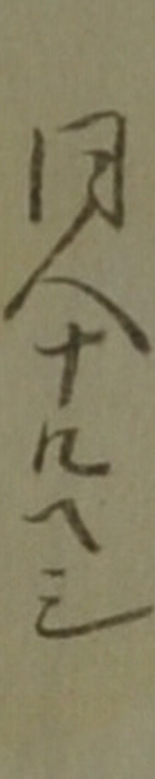同人ナルヘシ
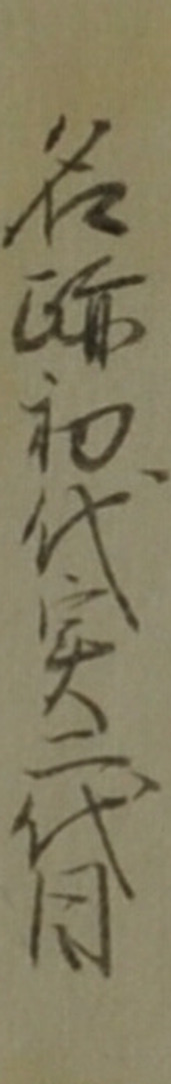名跡初代実二代目
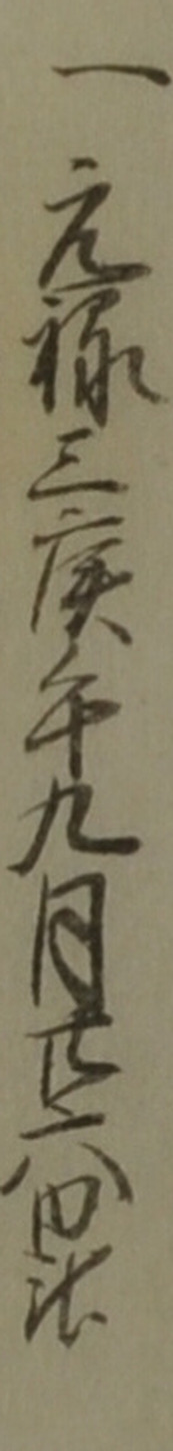一元禄三庚午九月廿六日被
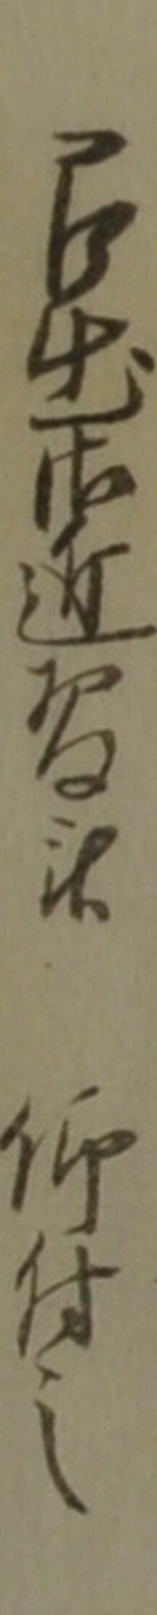召出御近習被仰付之
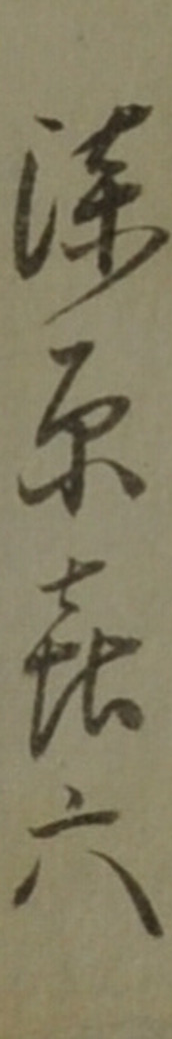漆原喜六
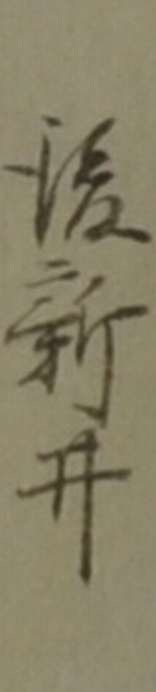後新井
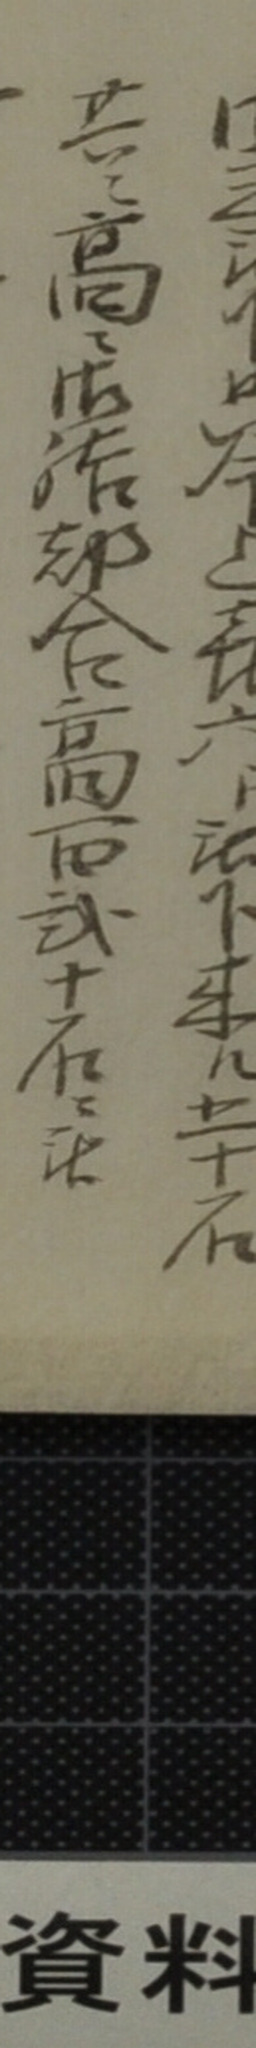共ニ高ニ御結都合高百弐十石ニ被
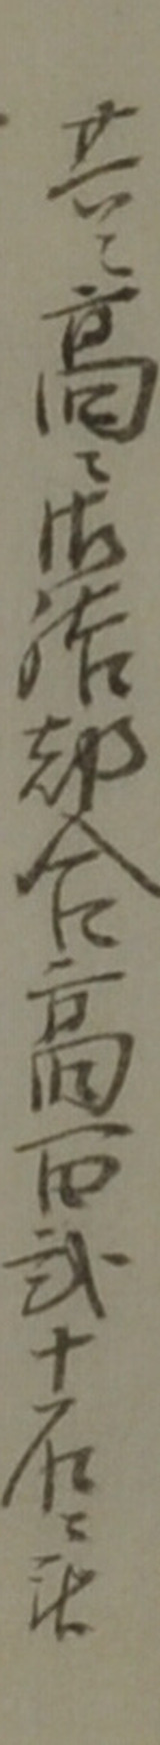共ニ高ニ御結都合高百弐十石ニ被
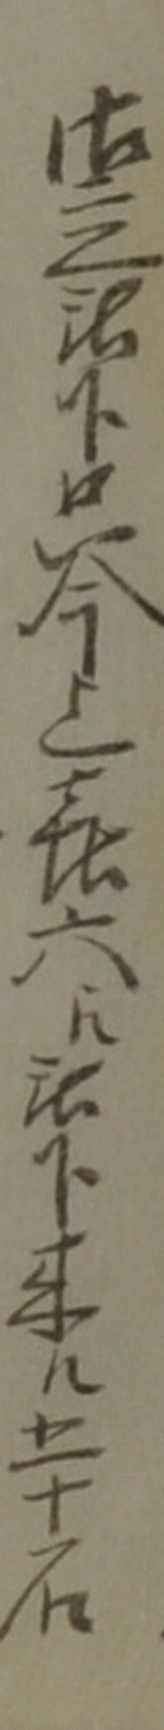御立被下只今迄喜六江被下来ル五十石
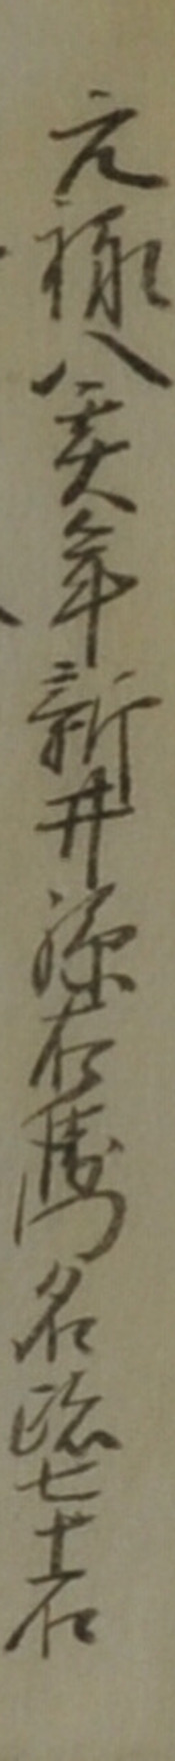元禄八亥年新井孫右衛門名跡七十石
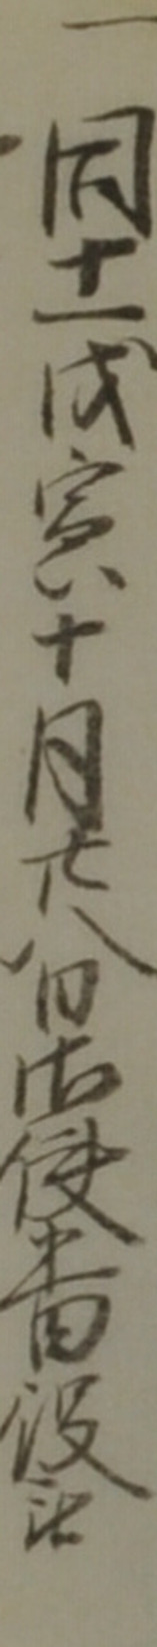一同十一戊寅十月廿八日御使番役被
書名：諸御役代々録（五）
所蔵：伊那市立高遠町図書館・合同会社AMANE
